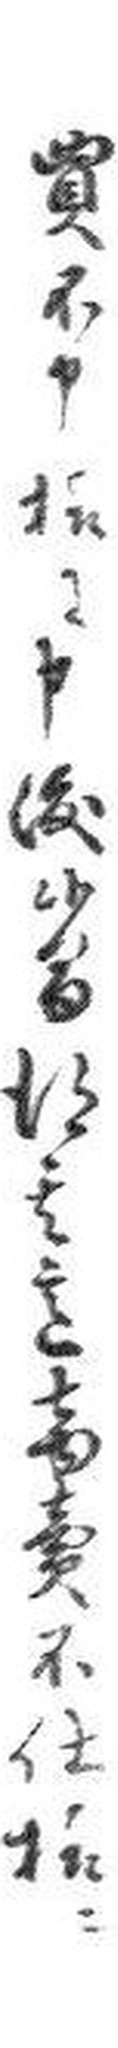買不申様に申渡候間得其意商売不仕様ニ
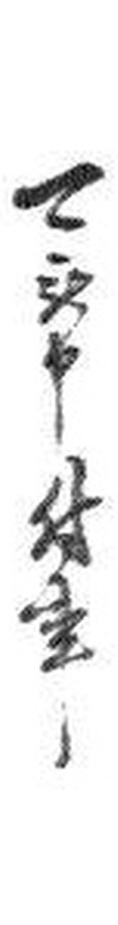可被申付事
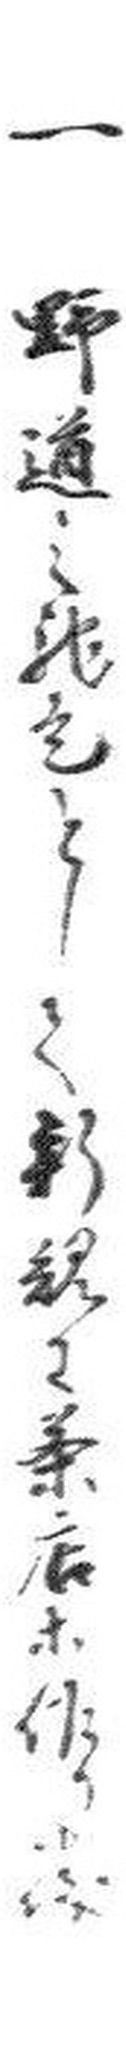一野道の馳走として新規に茶店等作り候儀
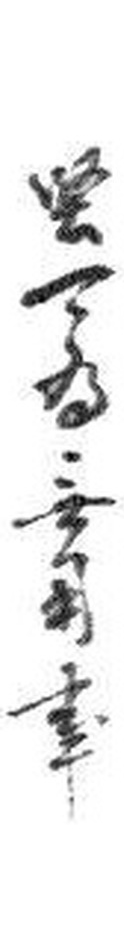堅可為無用事
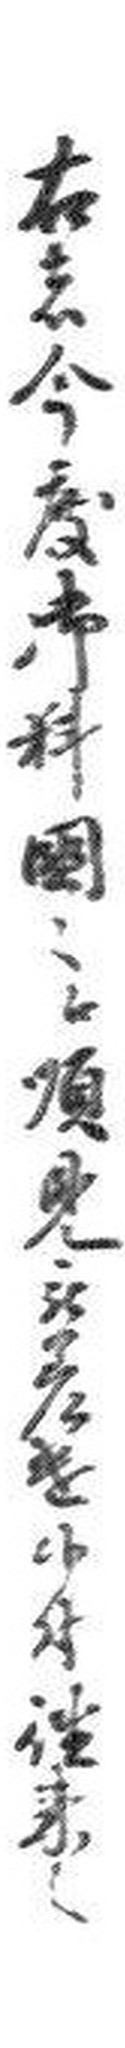右者今度御料国々江順見被差遣候付往来之
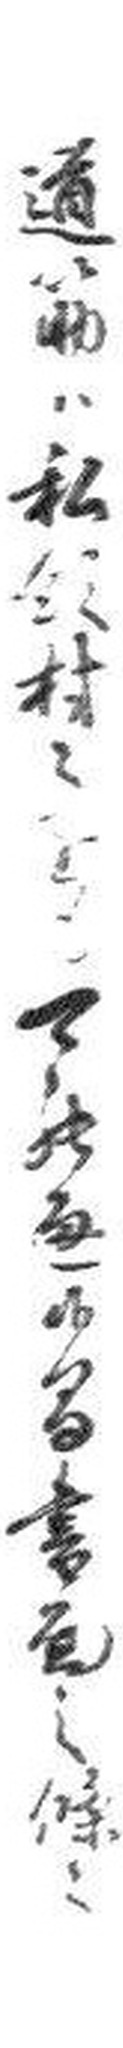道筋ハ私領村々をも可罷通候間書面之條々
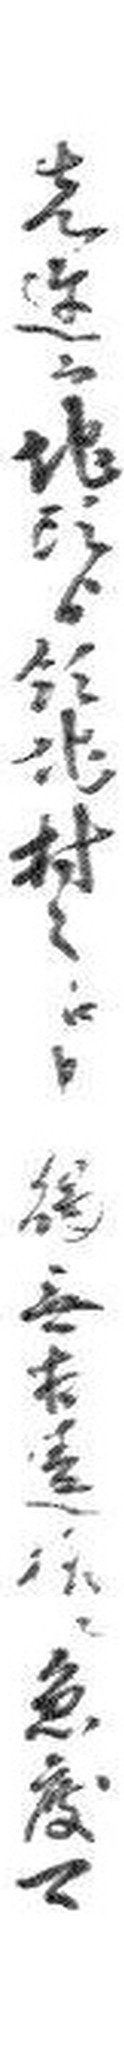先達而地頭ゟ領地村江申触無相違様ニ急度可
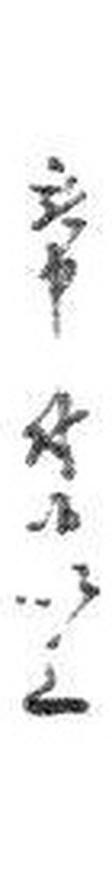被申付候以上
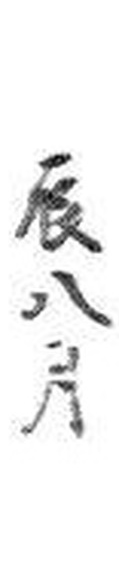辰八月
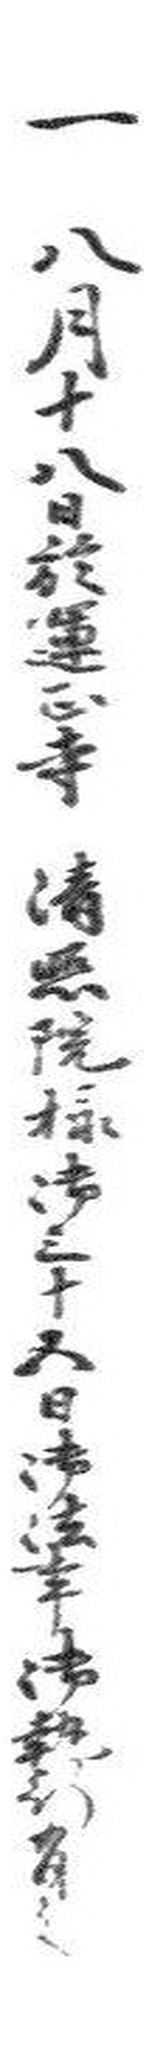一八月十八日於運正寺清照院様御三十五日御法事御執行有之
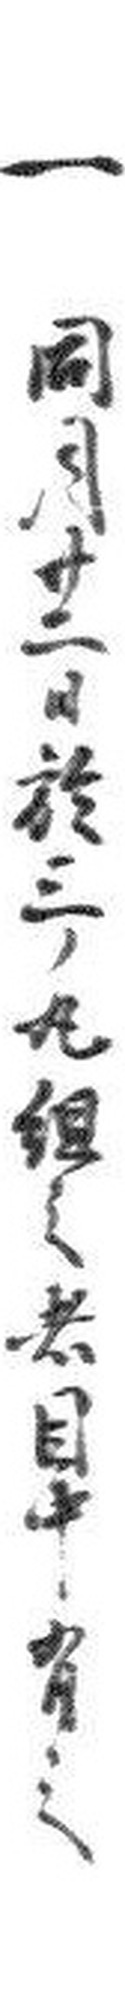一同月廿二日於三ノ丸組之者目中有之

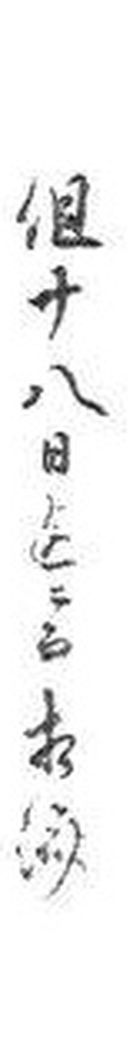但廿八日迄ニ而相済
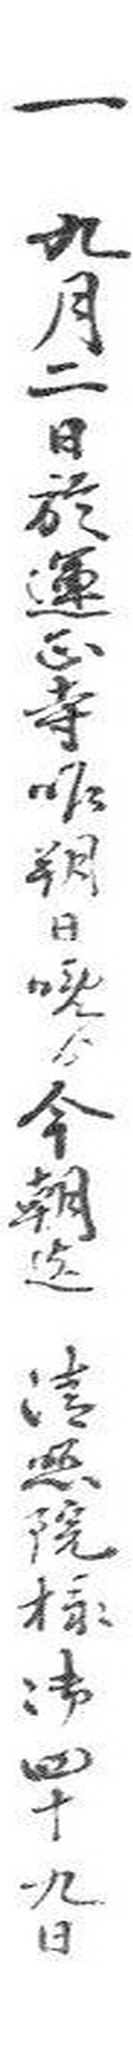一九月二日於運正寺昨朔日晩ゟ今朝迄清照院様御四十九日
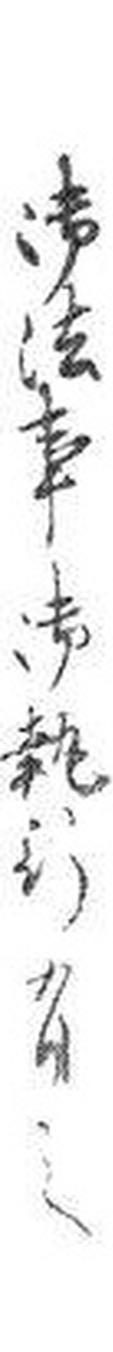御法事御執行有之
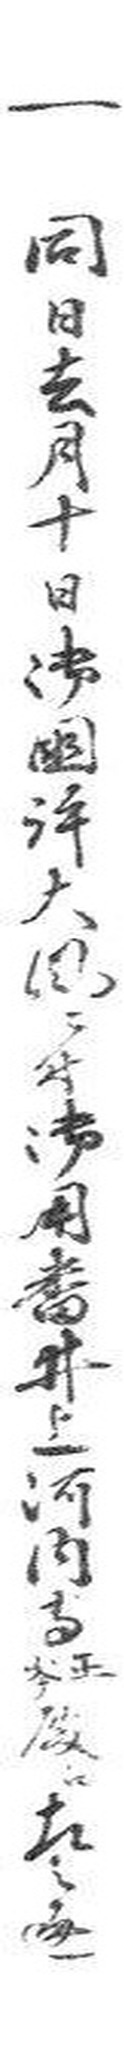一同日去月十日御国許大風ニ付御用番井上河内守正峯殿江左之通
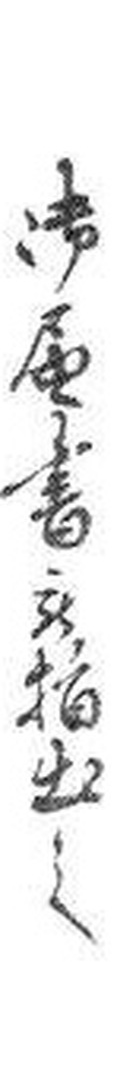御届書被指出之
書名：家譜 二十九 吉邦公 従正徳二年到正徳三年
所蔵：福井県文書館 Fukui Prefectural Archives
